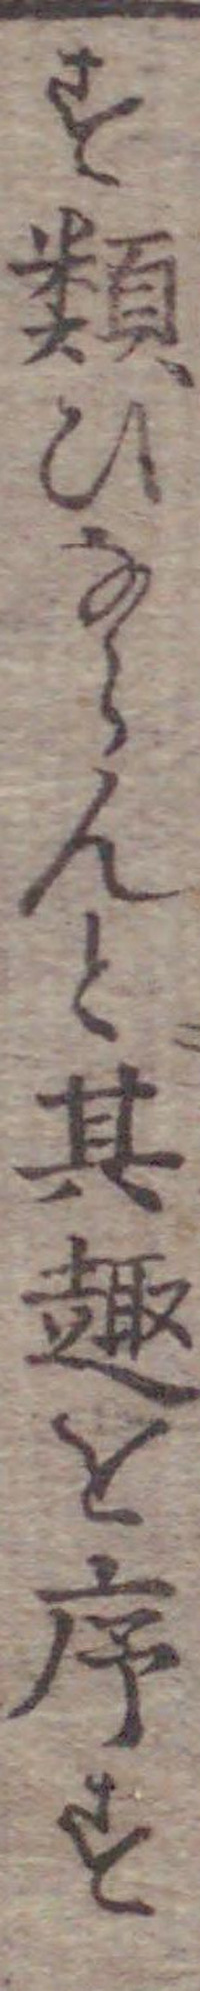す類ひならんと。其趣を序す

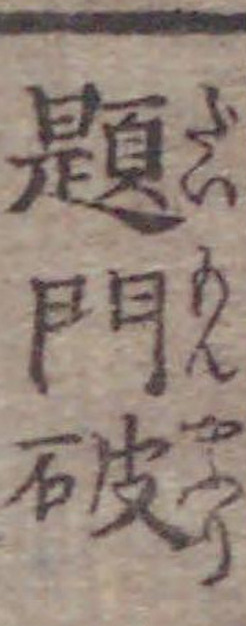題門破
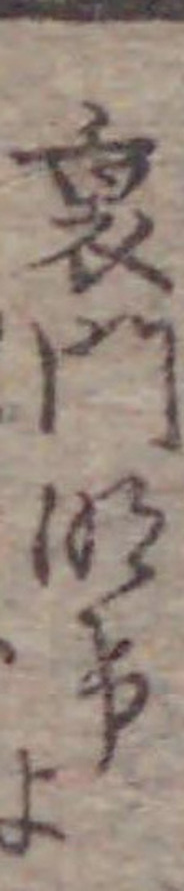裏門明けよ
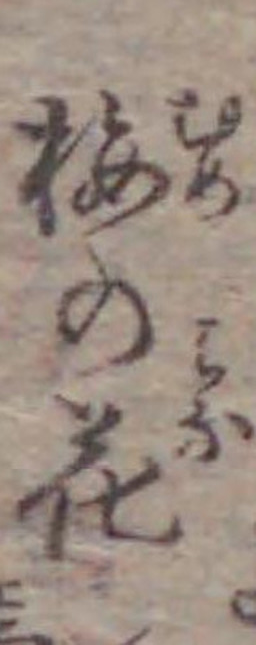梅の花
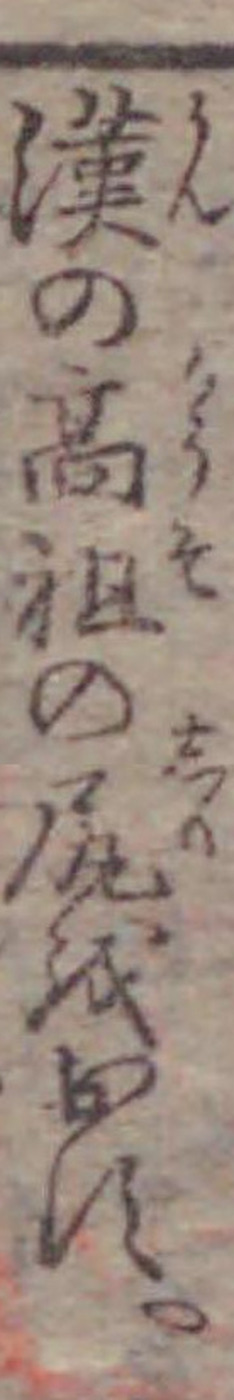漢の高祖の尻をおす。
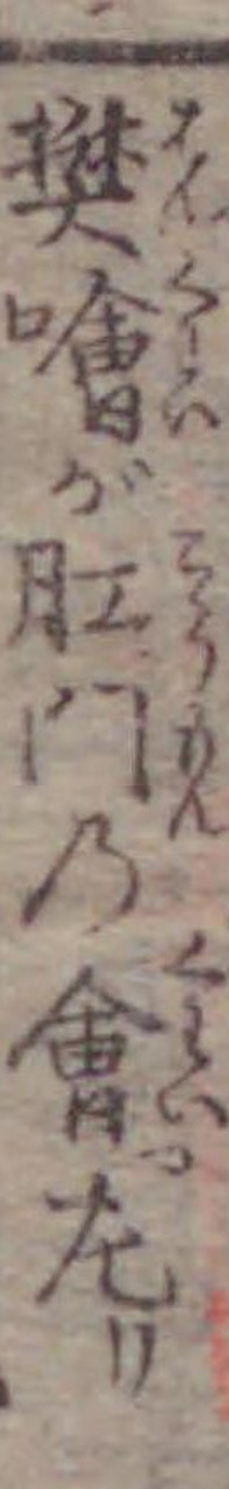樊噲が肛門の会。左り
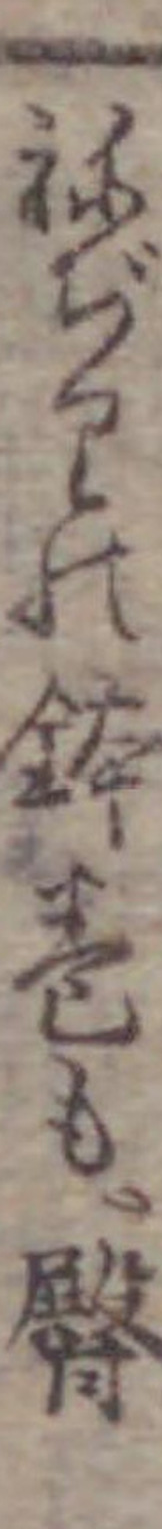ねぢりの鉢巻も臀
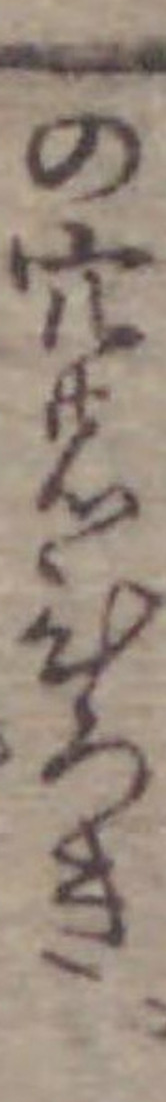の穴のひろき。
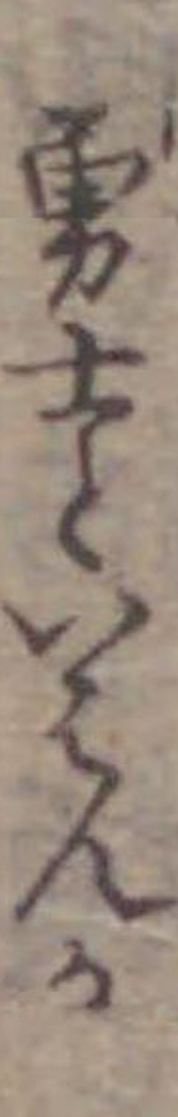勇士といはんか
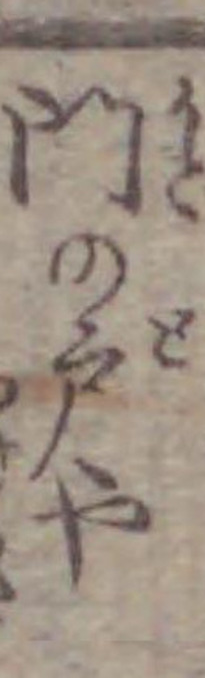門の戸や
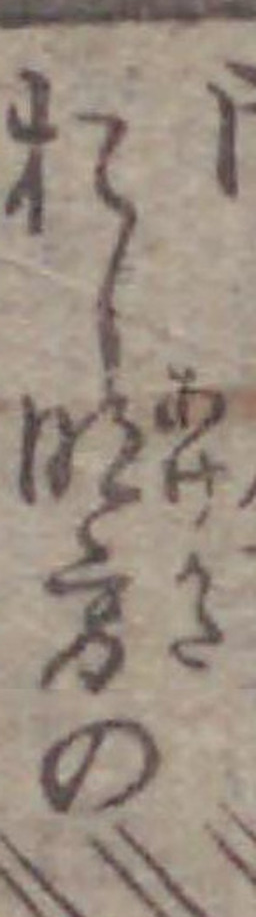おし明方の
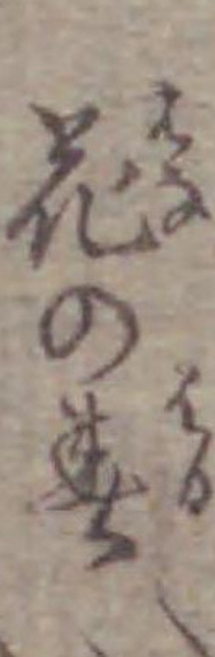花の春
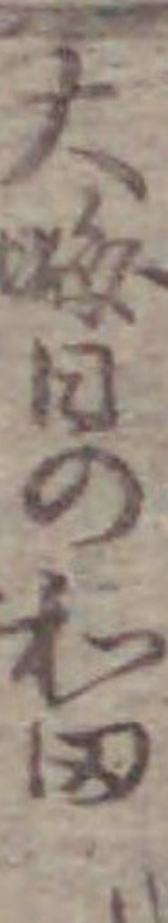大晦日の和田
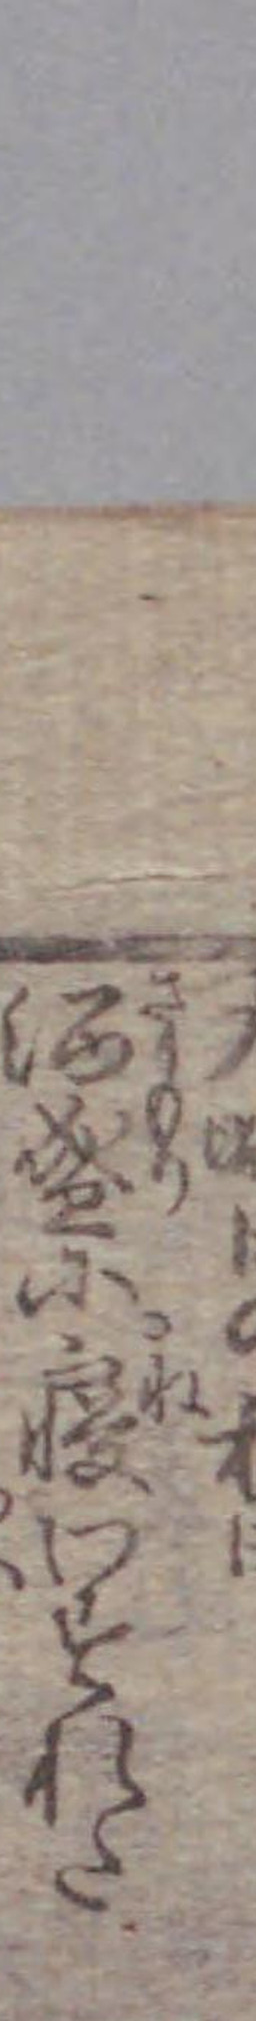酒盛に。寝わすれた
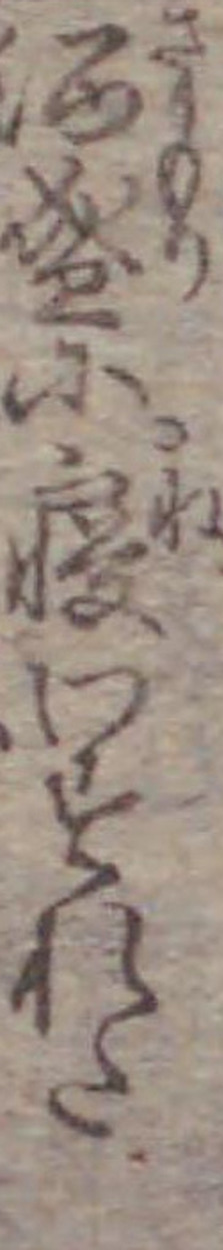酒盛に。寝わすれた
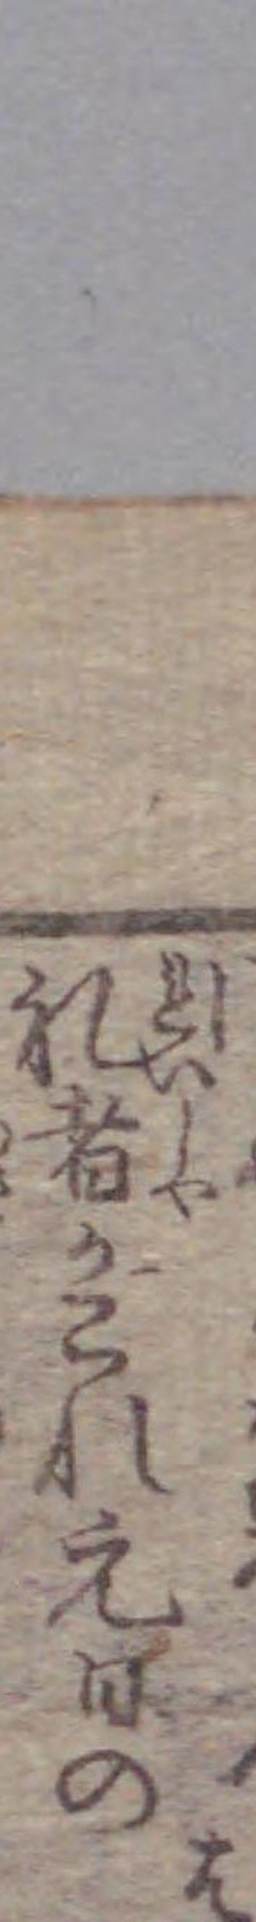礼者かこれ元日の
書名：武者合天狗俳諧 : 2巻
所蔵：国立国会図書館 National Diet Library, JAPAN
